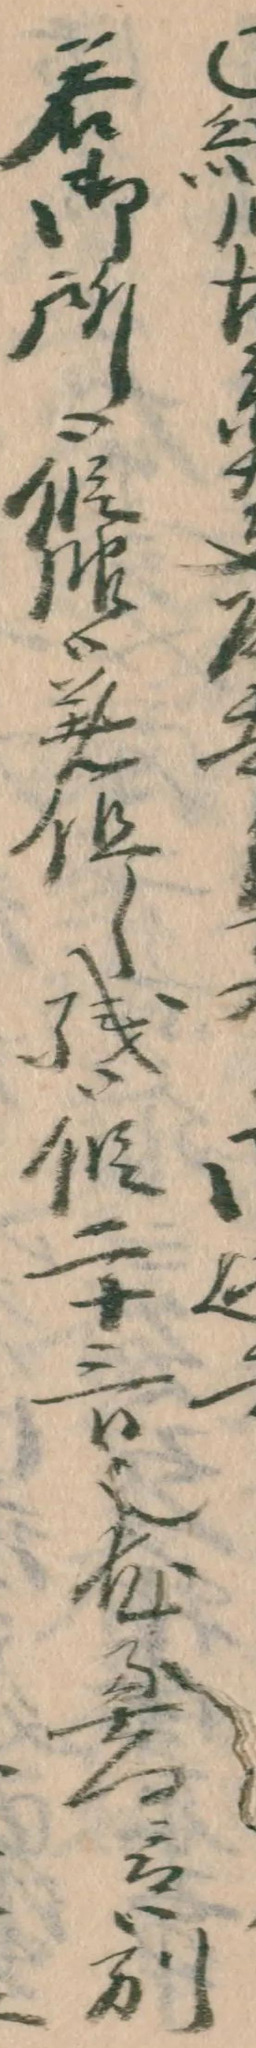若御所御假服御着但し残御假二十三日也尤奥向ニ而ハ別
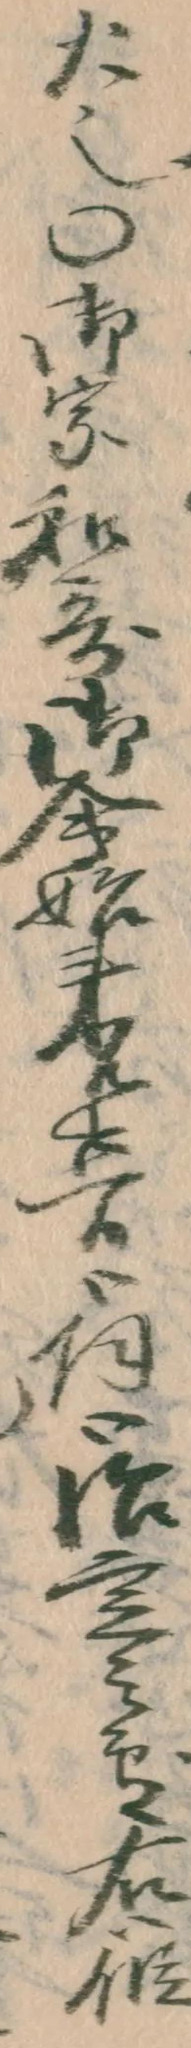火也○御家和歌御會始来ル廿一日御伺御治定之處右御假
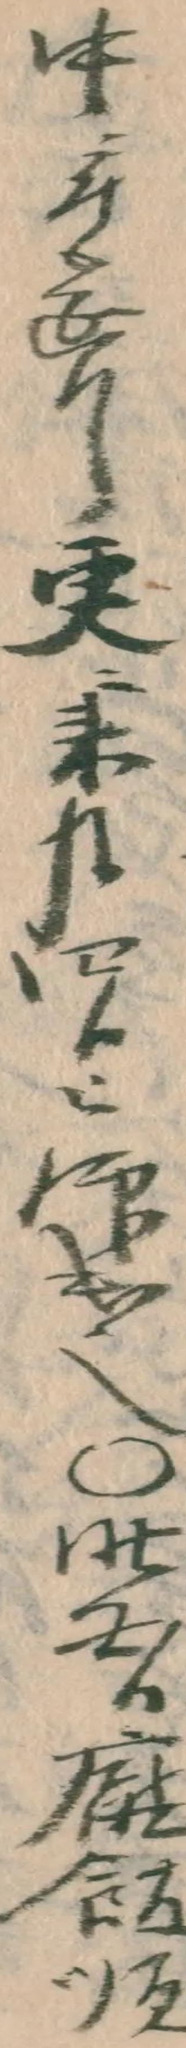中ニ付御延引更ニ来月四日被仰出也○昨五日廰飯順
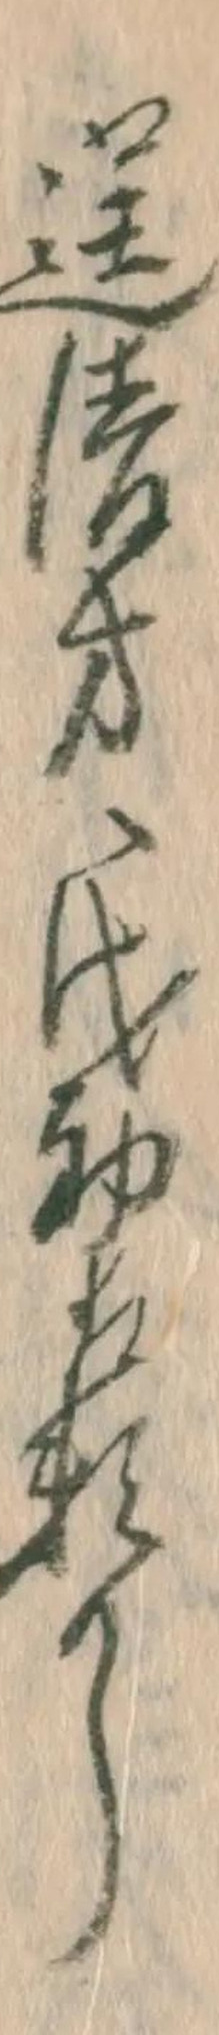逞清方へ代勤相頼了
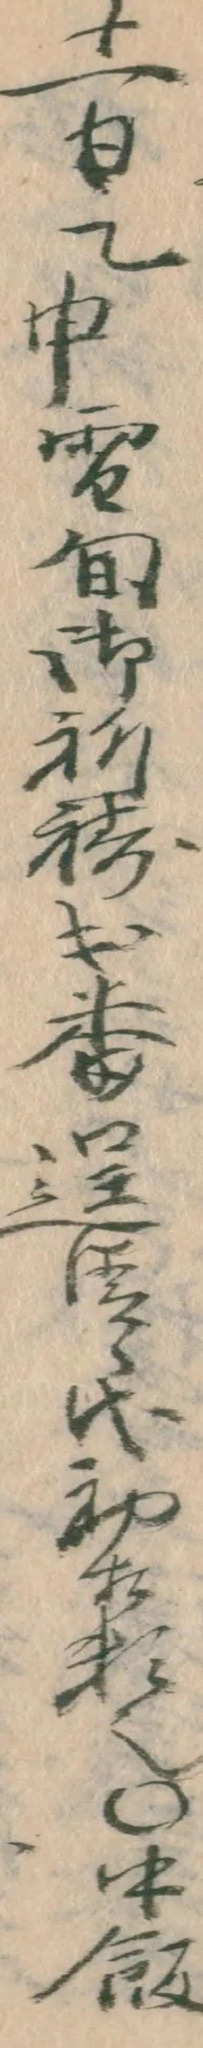十一日乙申雪旬御祈祷出番逞清ヘ代勤相頼也〇中飯
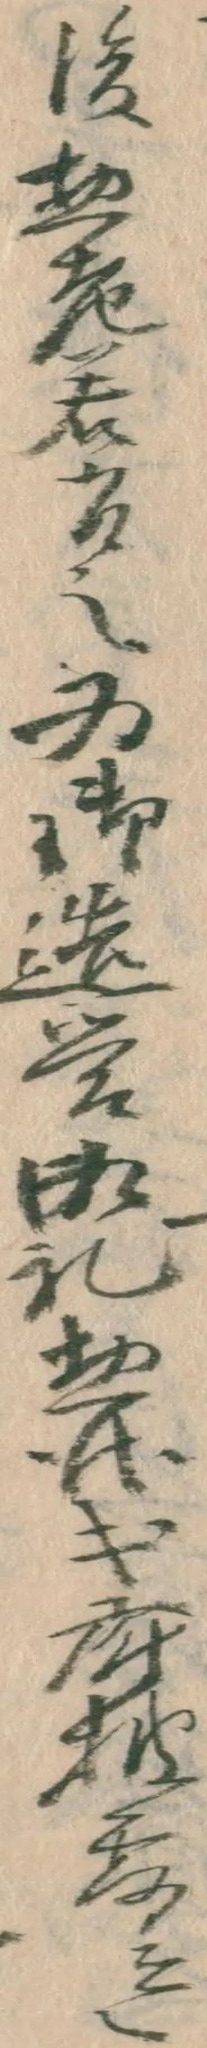後惣老若有之為御造営御礼惣代出府披露云々
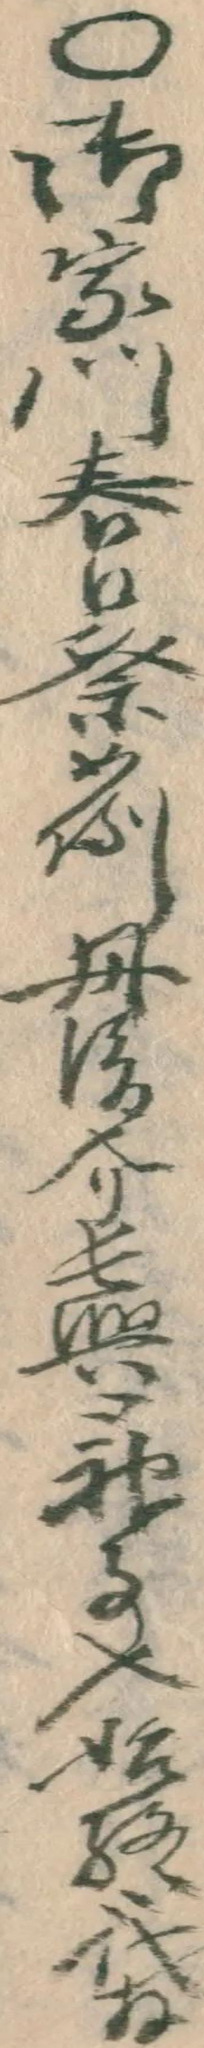○御家門春日祭如例丹後介長與御神事入始終御代官
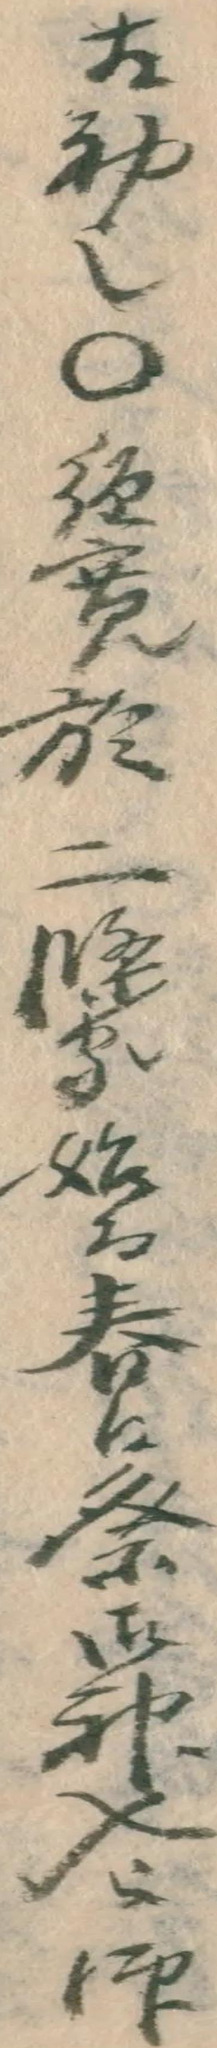相勤之◯経寛於二條家始而春日祭御神入被仰
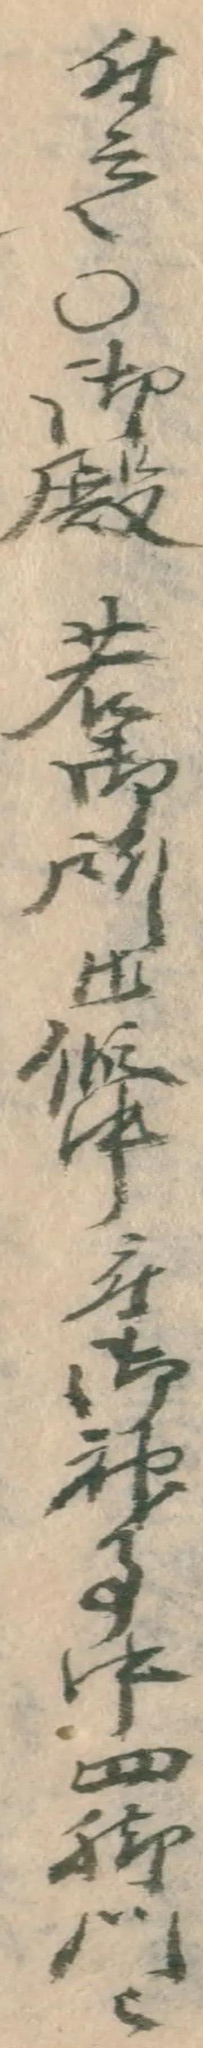付云々○御殿若御所御假中ニ付御神事中四脚門被
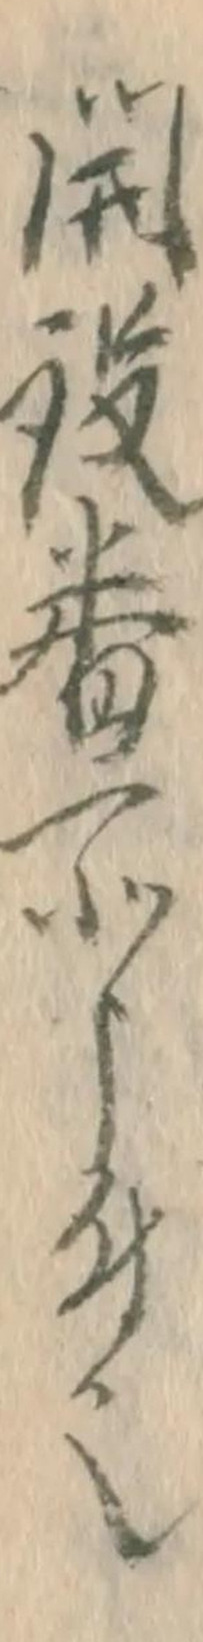開設番所申付也
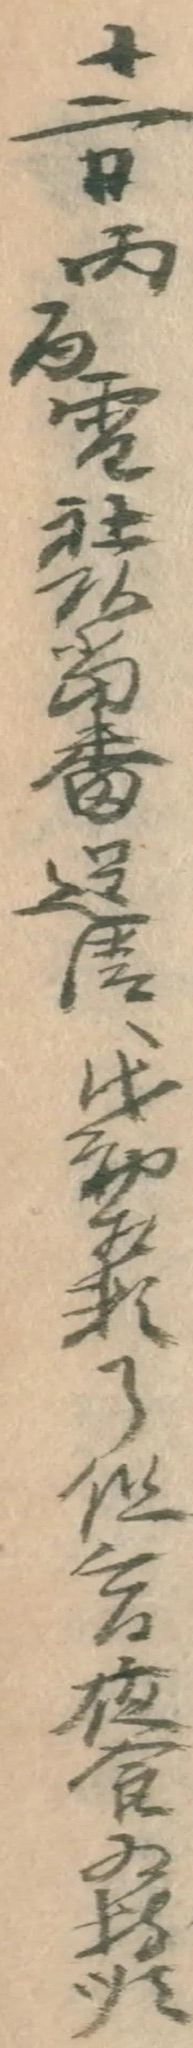十二日丙辰雪社頭當番逞清へ代勤相頼了但今日夜食為持順

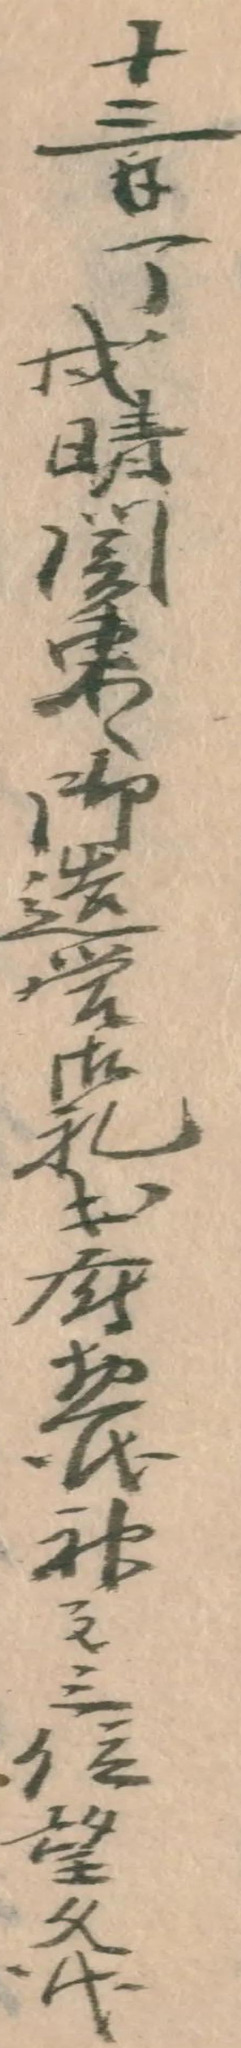十三日丁戌晴関東へ御造営御礼出府惣代神主三位望久代
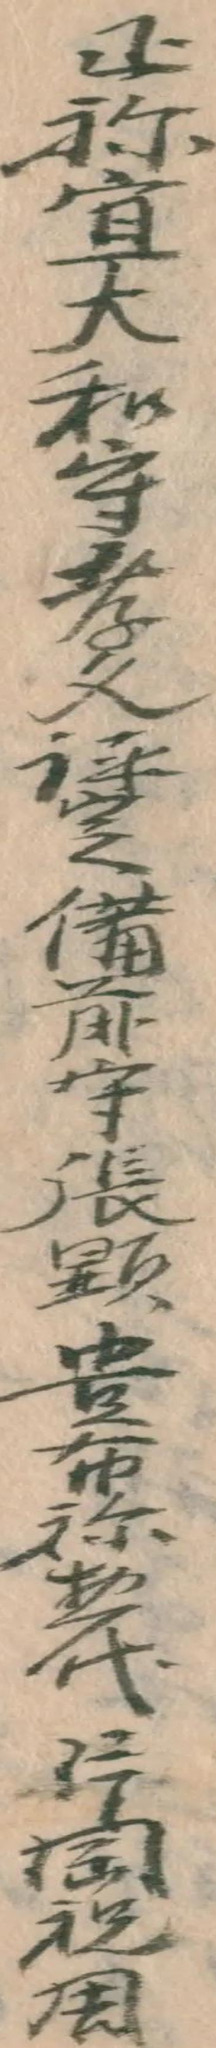正称宜大和守孝久評定備前守張顕豊布称惣代片岡祝周
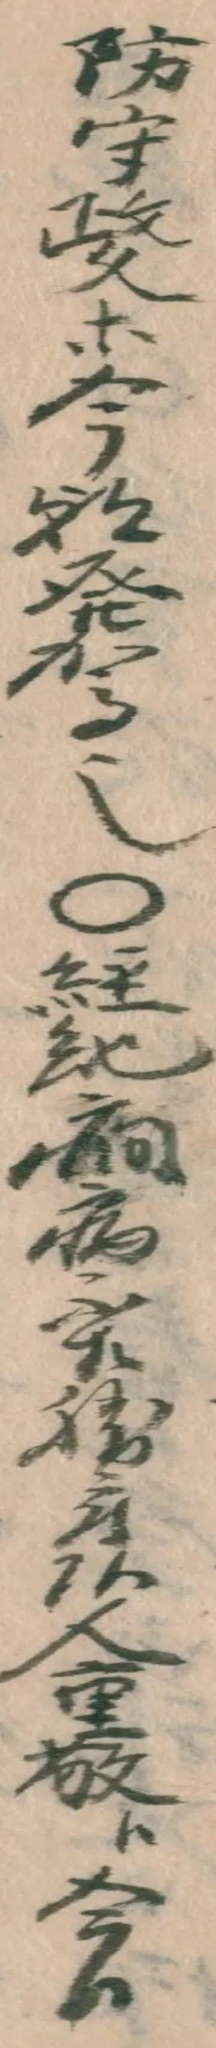防守政久等今朝発駕也○経記痛病不相勝ニ付頭人重敬え今日
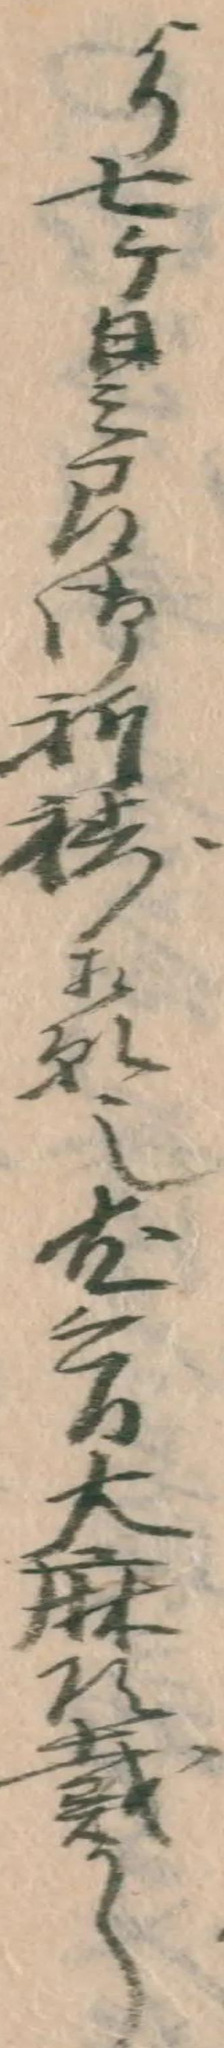より七ヶ日之間御祈祷相願也尤今日大麻頂戴了
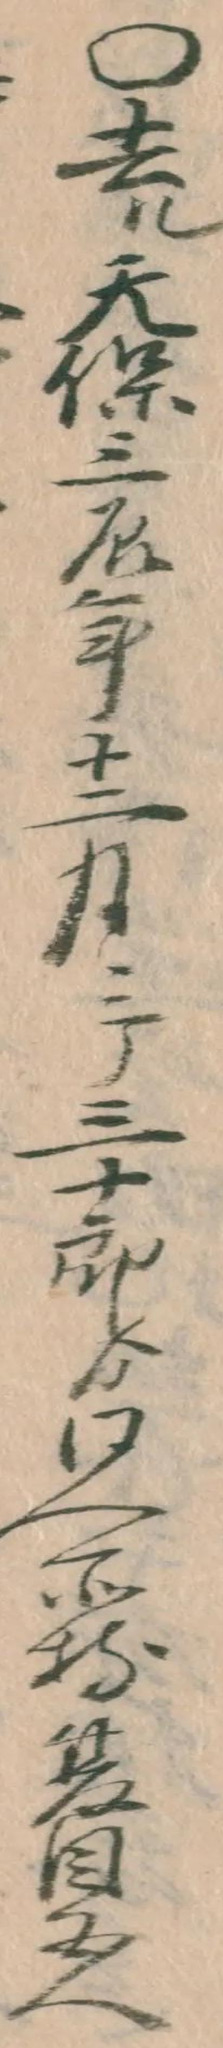○去ル天保三辰年十二月ニ三ノ三十郎ゟ同人所持麦目五人
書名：賀茂社記録. 第67冊
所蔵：国立国会図書館 National Diet Library, JAPAN
